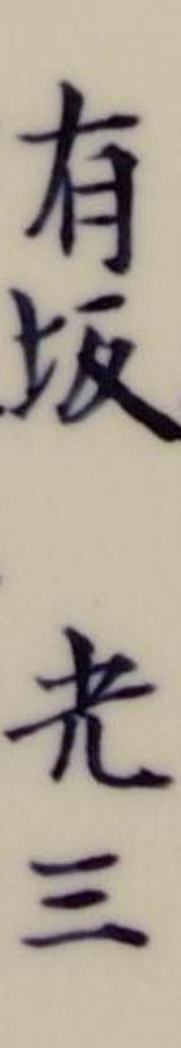有坂光三
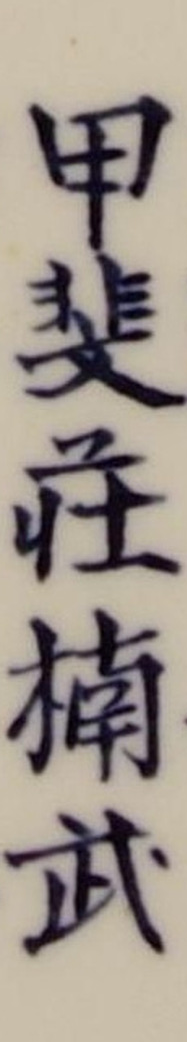甲斐荘楠武
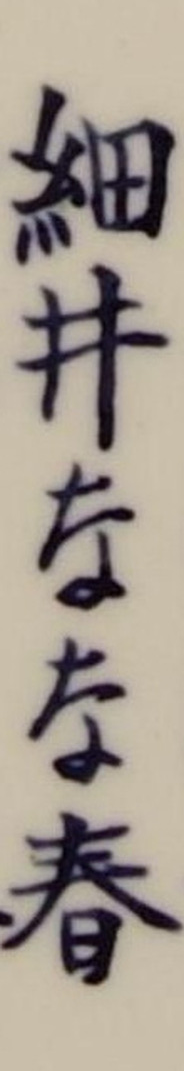細井なな春
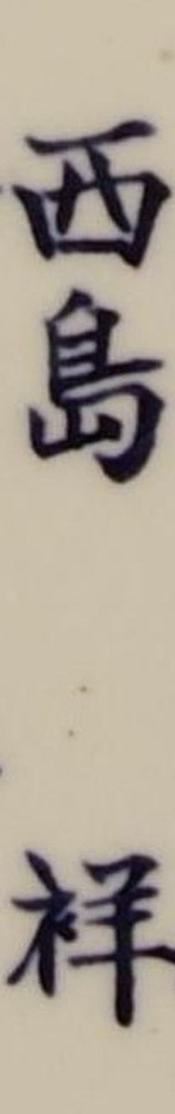西島祥
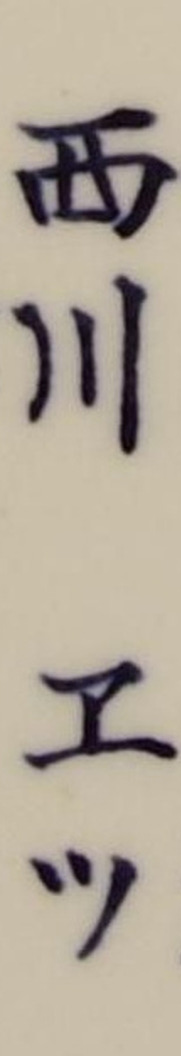西川ヱツ
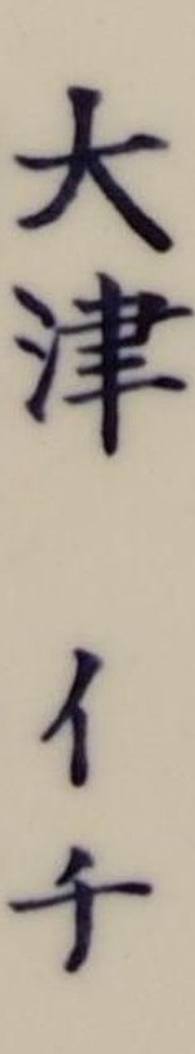大津イチ
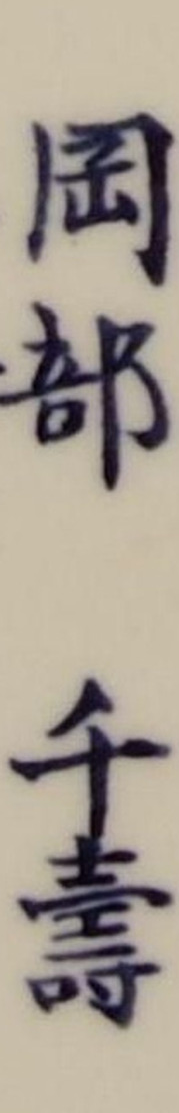岡部千代
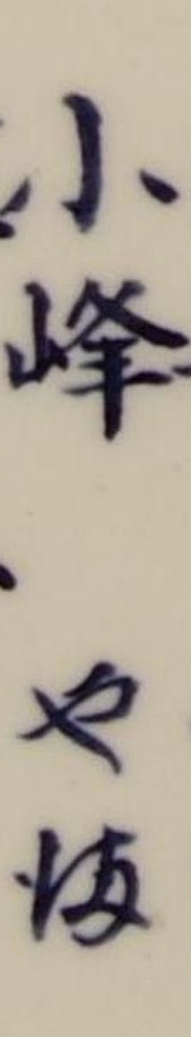小峰やま
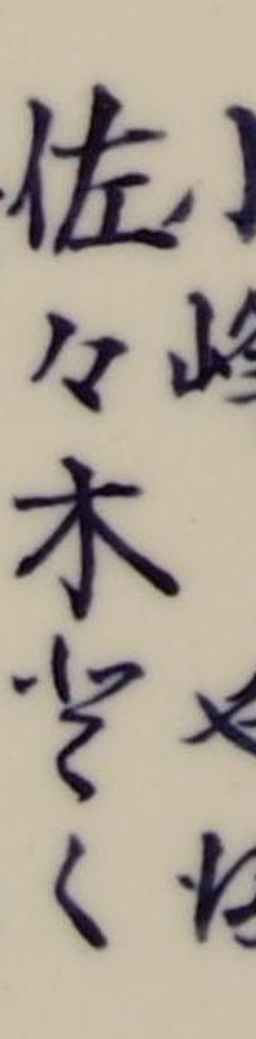佐々木とく
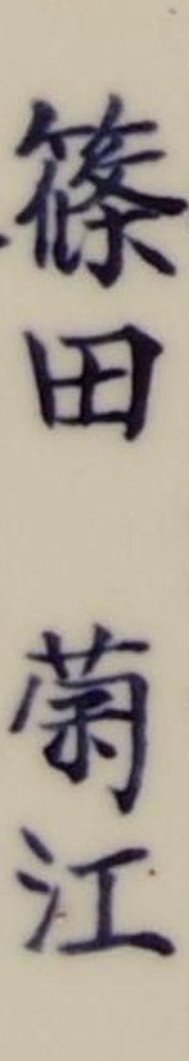篠田菊江
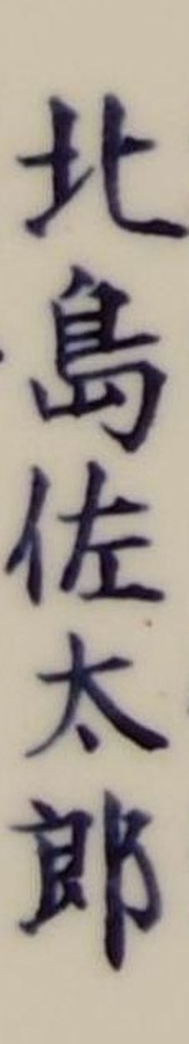北島佐太郎

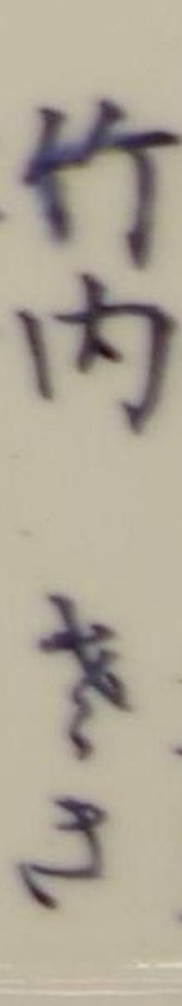竹内さき
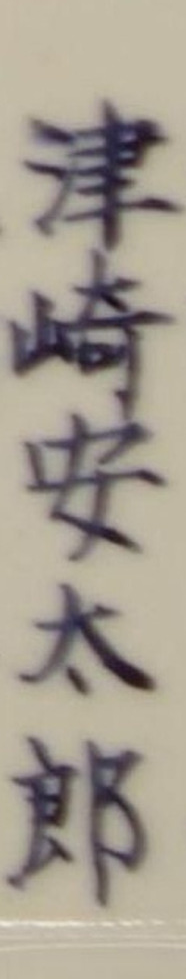津崎安太郎
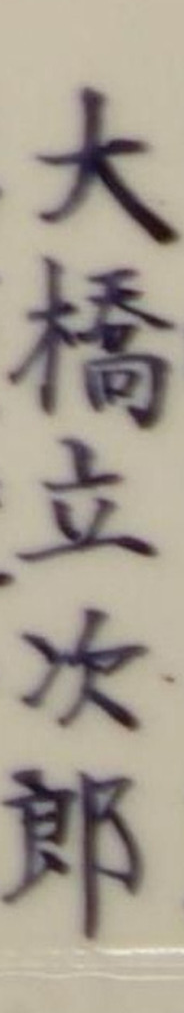大橋立次郎
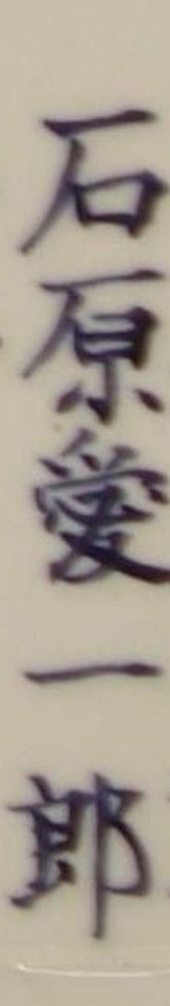石原愛一郎
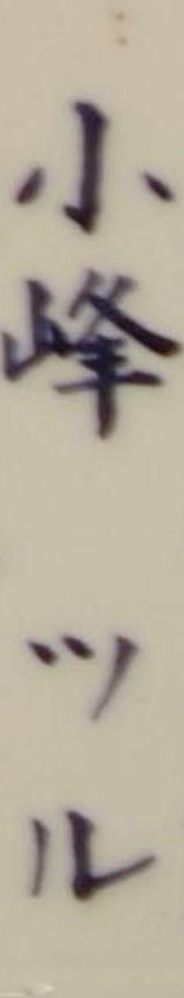小峰ツル
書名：M~S
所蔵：高野山金剛峯寺
